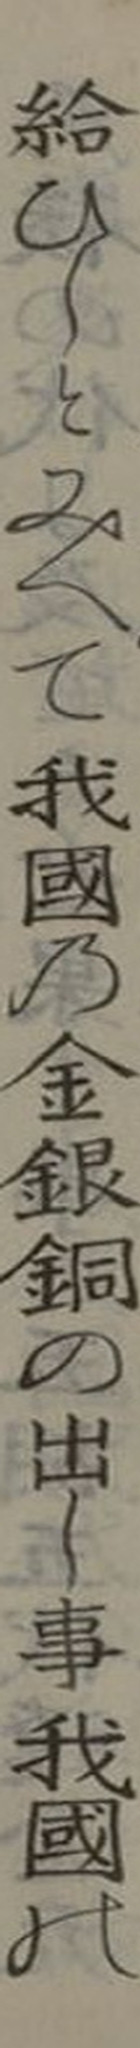給ひしとみへて我國の金銀銅の出し事我國の
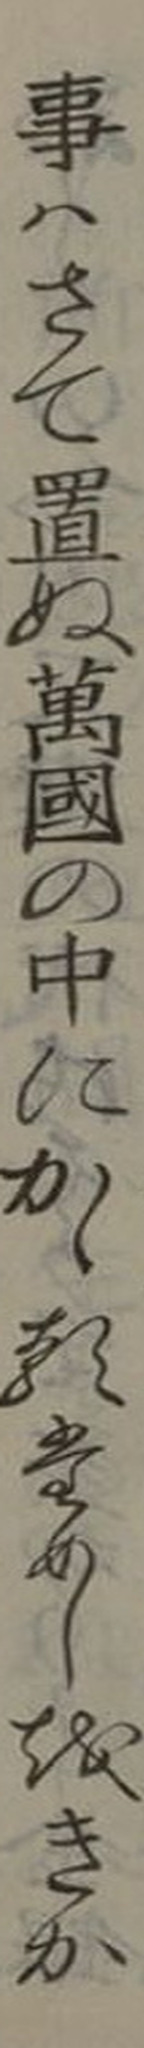事はさて置ぬ萬國の中にかゝるためしをきか
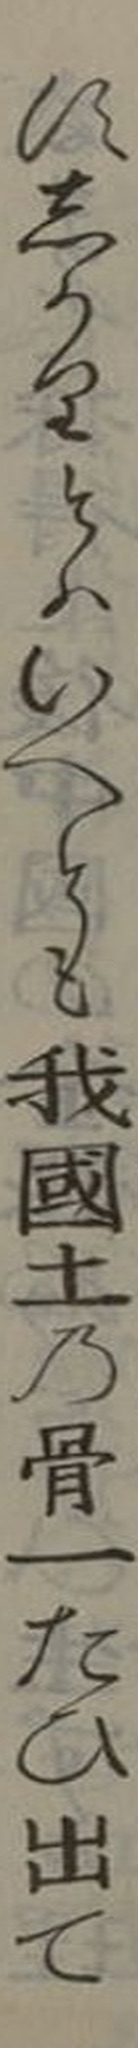すしかりとはいへとも我國土の骨一たひ出て
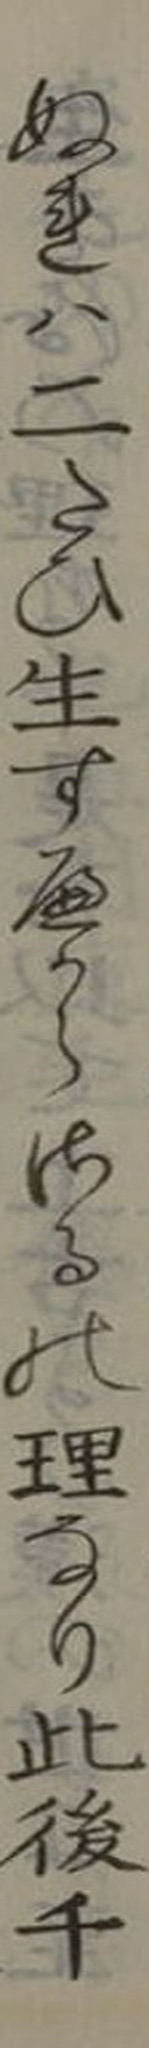ぬれは二たひ生すへからさるの理なり此後千
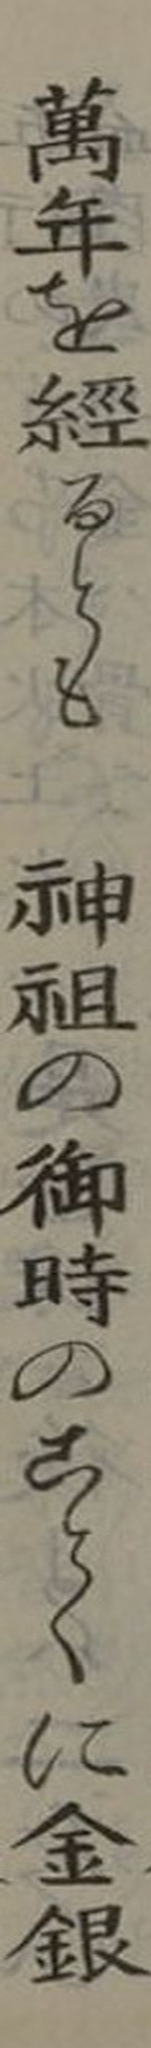萬年を經るとも神祖の御時のことくに金銀
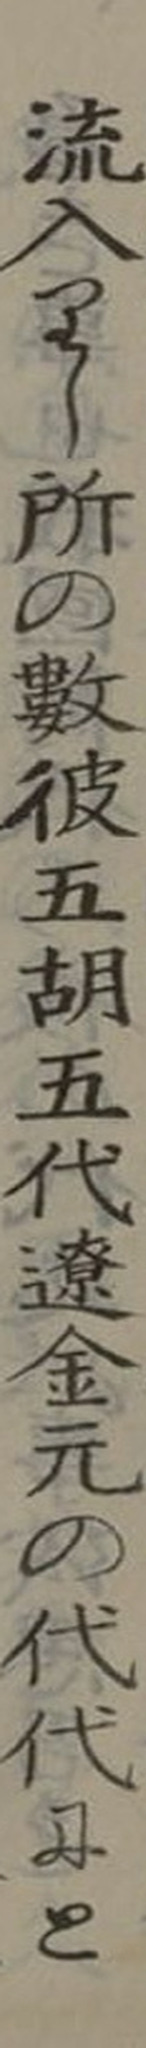流入れし所の數彼五胡五代遼金元の代代にと
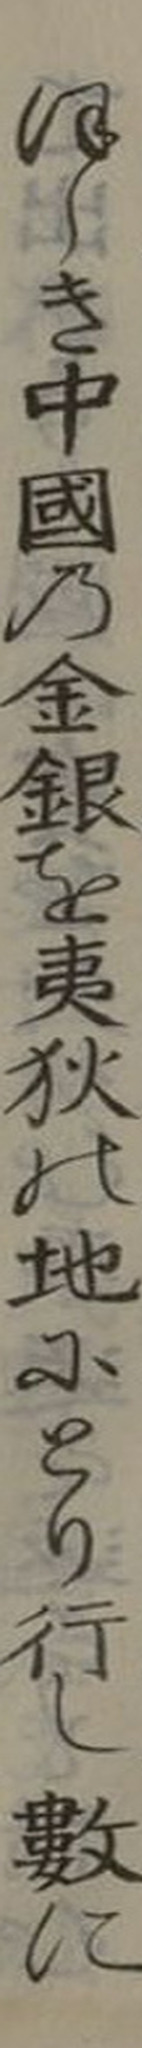ほしき中國の金銀を夷狄も地にとり行し數に
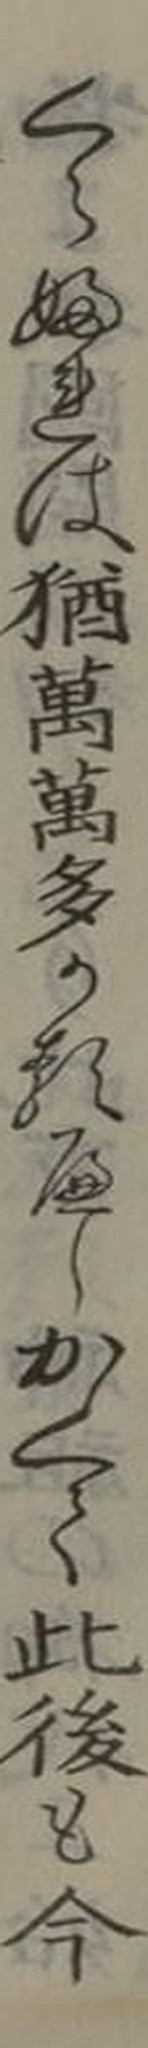くらふれは猶萬萬多かるへしかくて此後も今
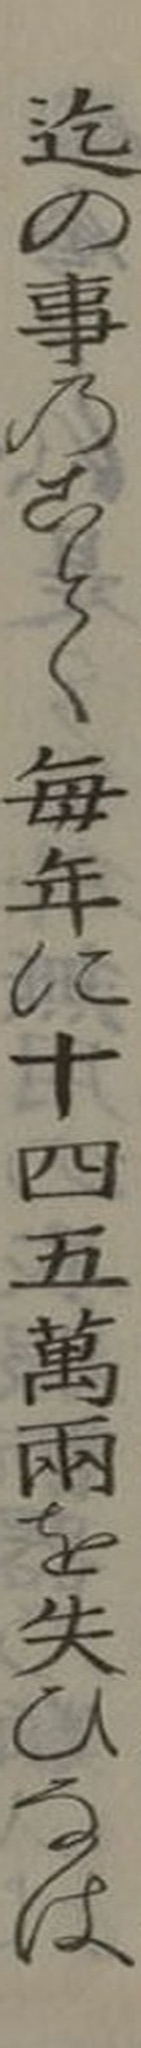迄の事のことく毎年に十四五萬兩を失ひなは
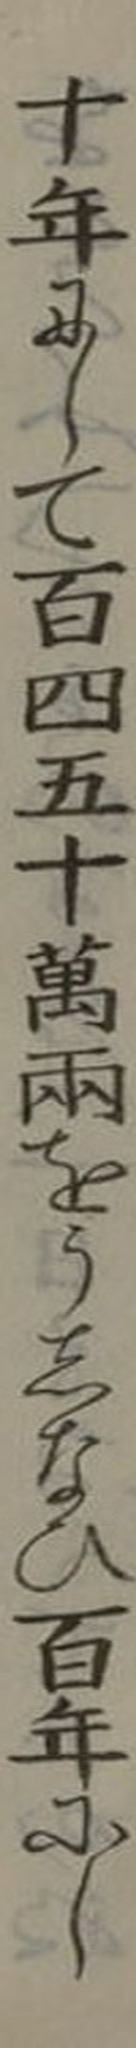十年にして百四五十萬兩をうしなひ百年にし
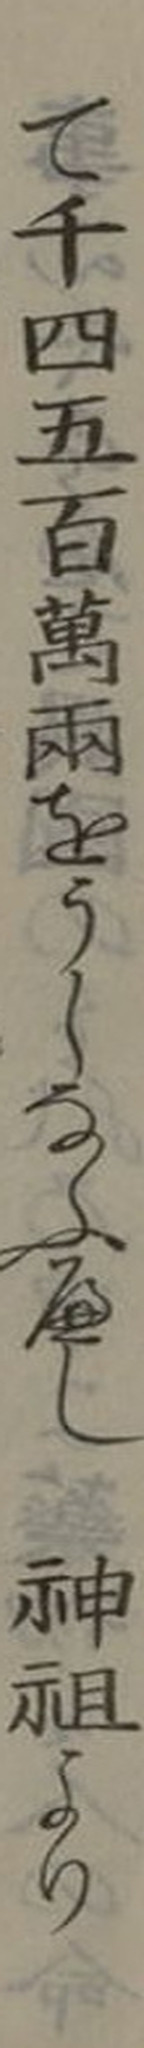て千四五百萬兩をうしなふへし神祖より
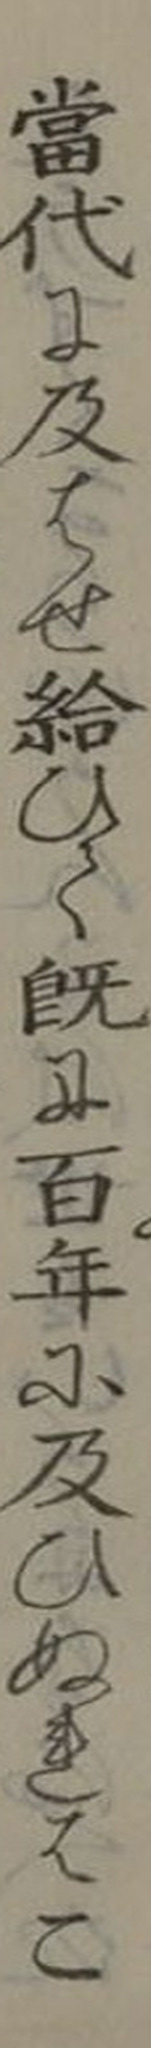當代に及はせ給ひて既に百年に及ひぬれはこ
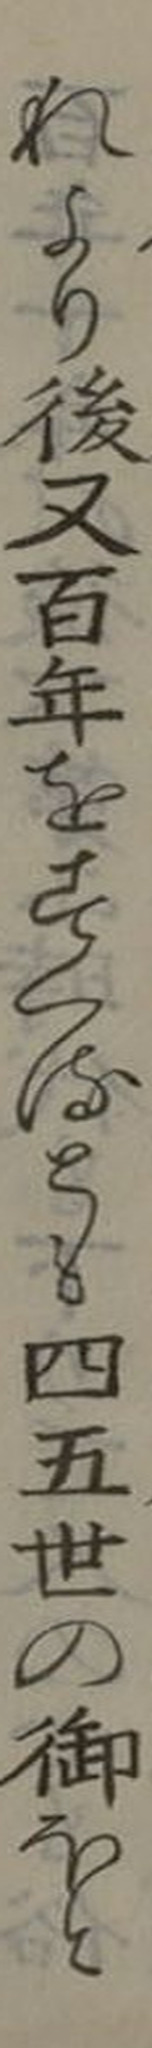れより後又百年をすくるとも四五世の御ほと
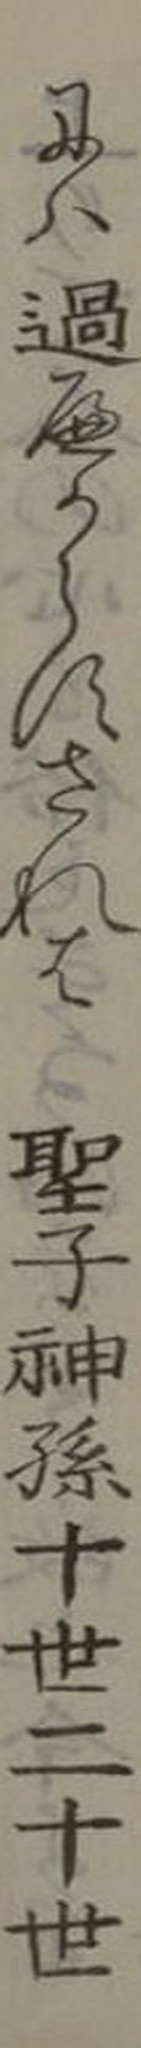には過へからすされは聖子神孫十世二十世
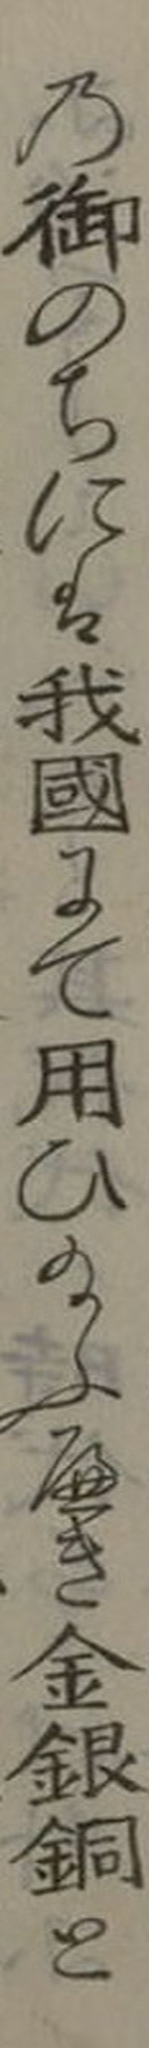の御のちには我國にて用ひ給ふへき金銀銅と
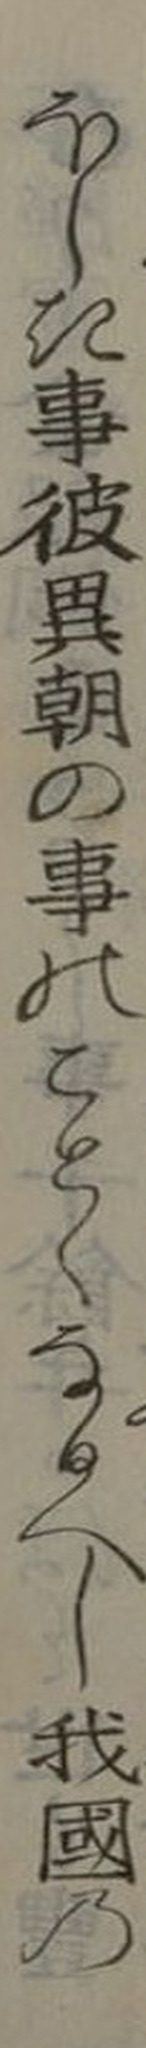ほしき事彼異朝の事のことくなるへし我國の
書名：骨董録
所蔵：University of the Ryukyus Library
